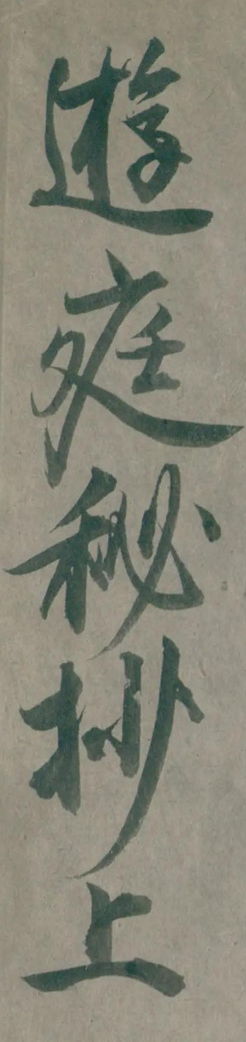遊庭秘抄上

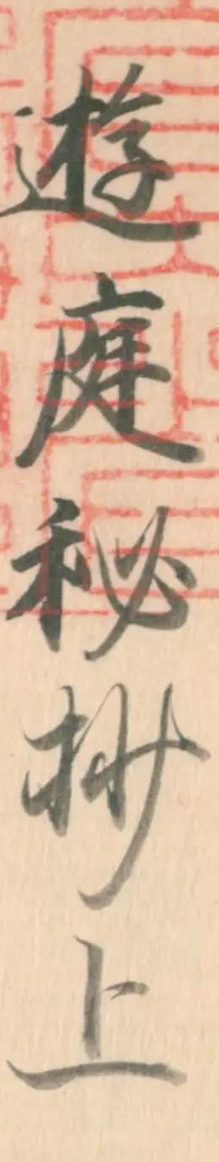遊庭秘抄上
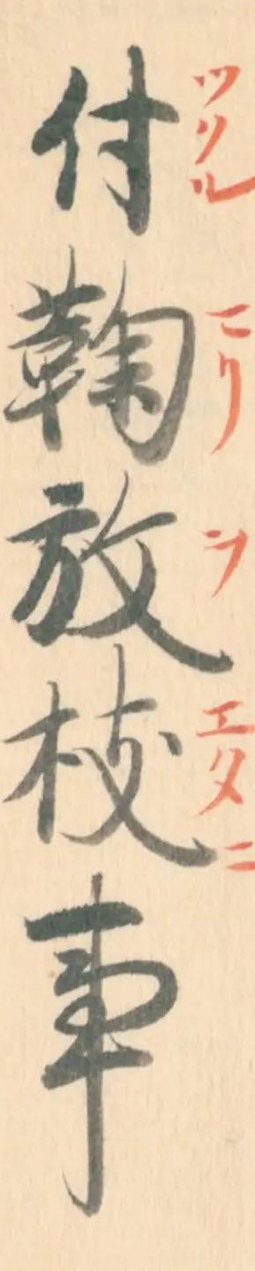付鞠放枝事

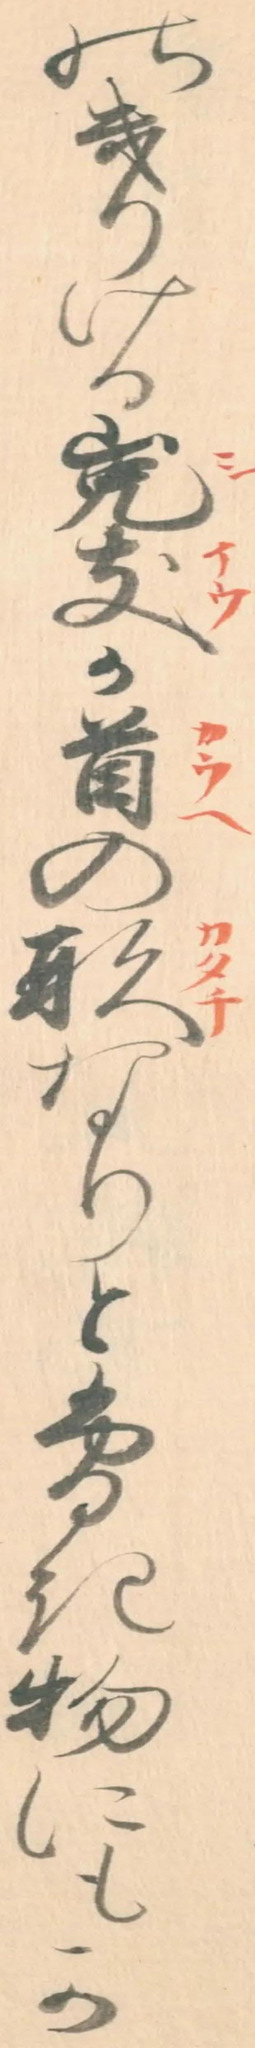のきりける蚩尤か首の形なりとふるき物にもか
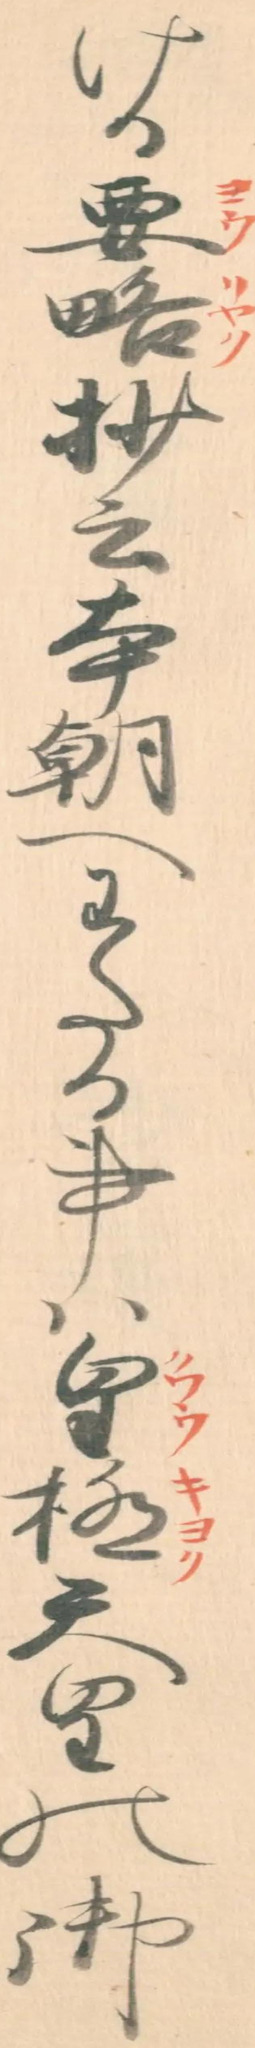ける要略抄云本朝へわたる事は皇極天皇の御
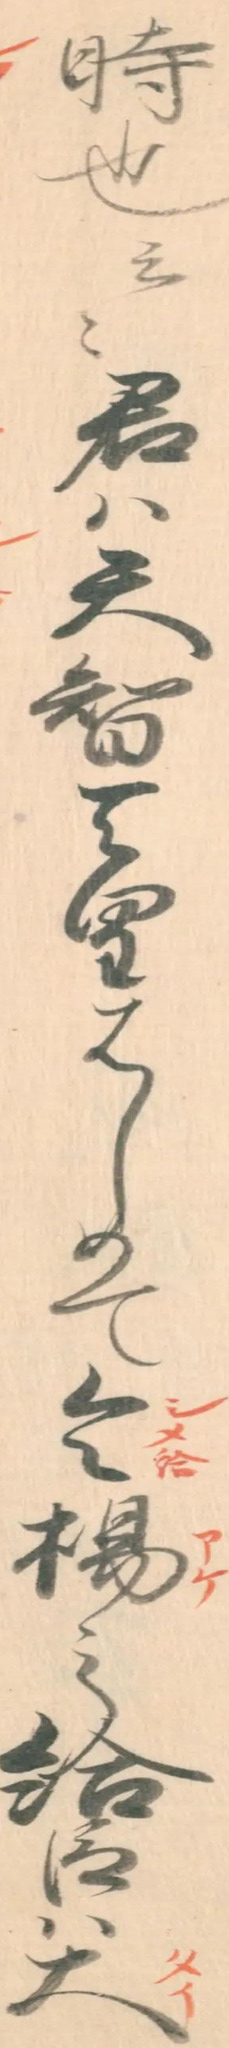時也云々君は天智天皇はしめて令楊之給臣は大
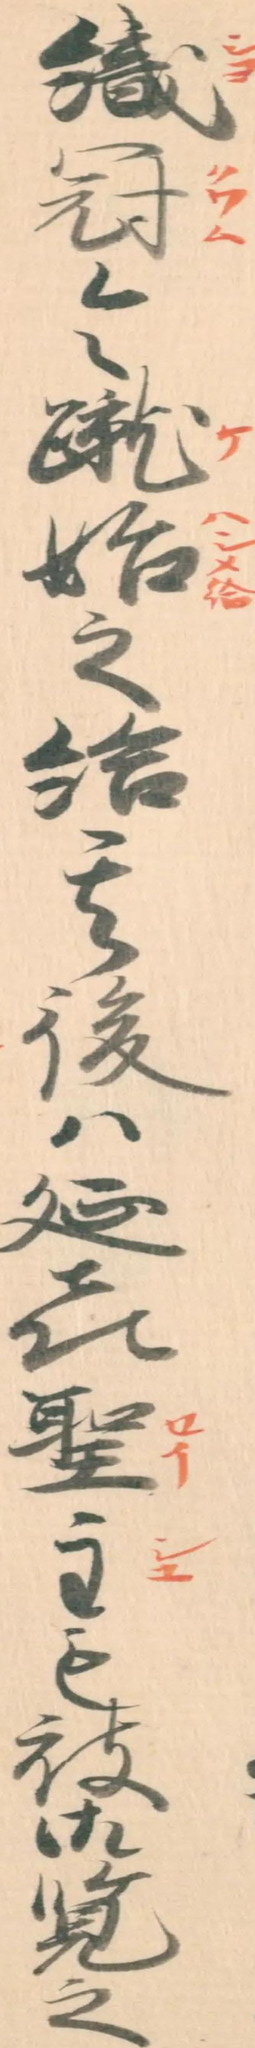織冠令蹴始之給其後は延喜聖主も被御覧之
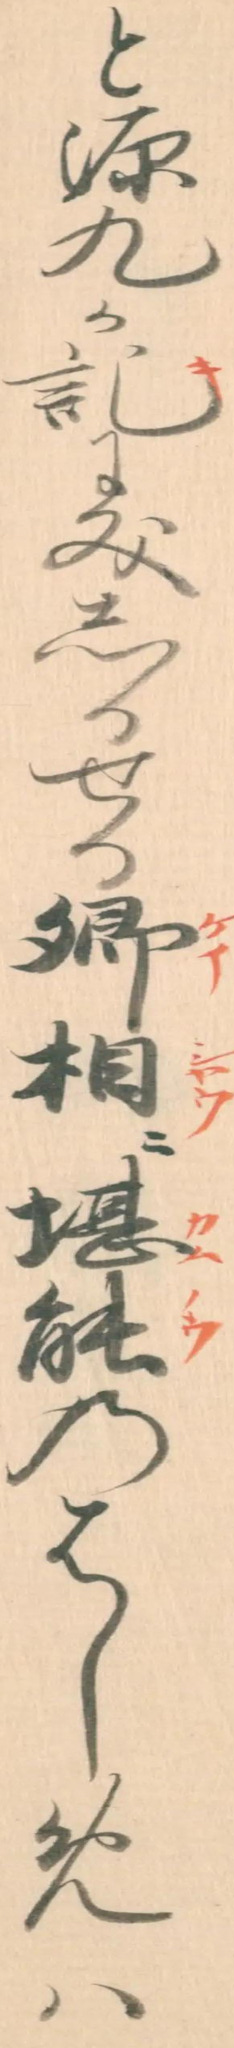と源九か記にもしるせる卿相に堪能のはしめは
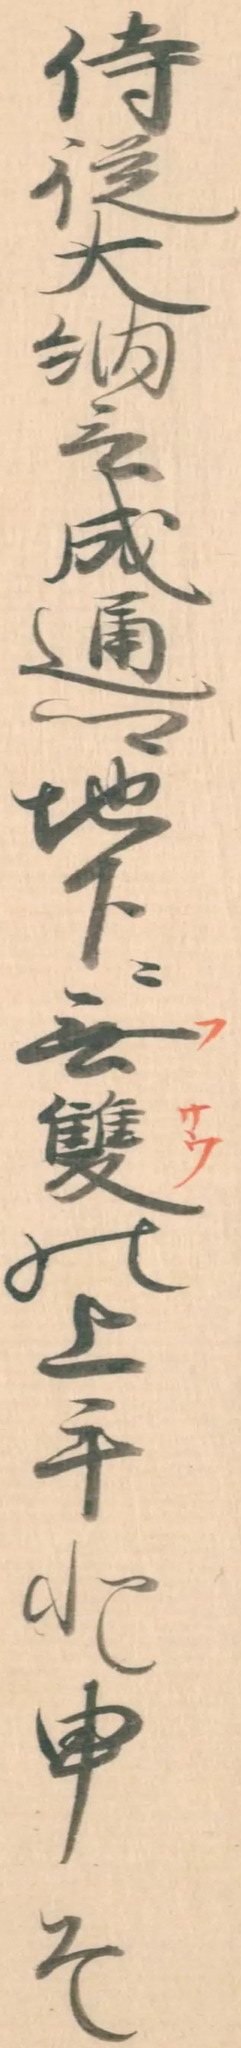侍従大納言成通卿地下に無雙の上手と申そ
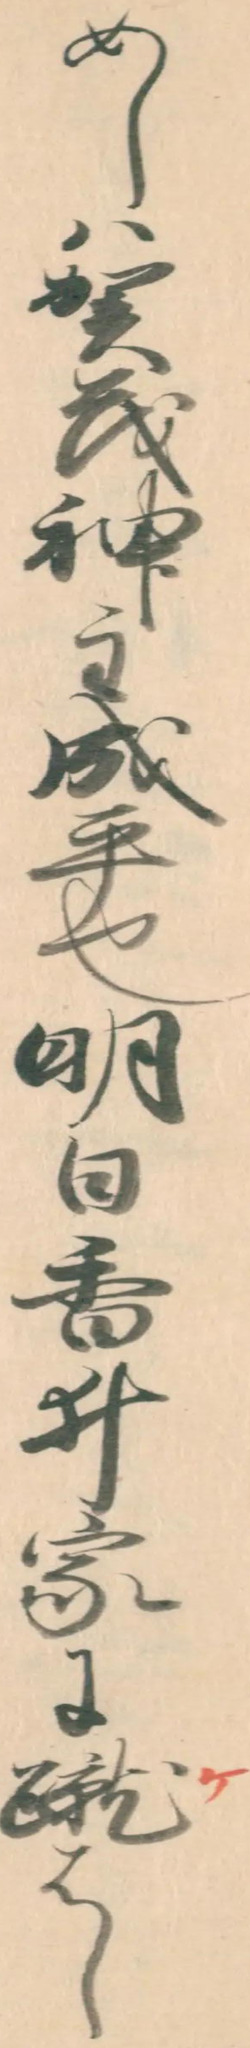めしは賀茂神主成平也明日香井家に蹴はし
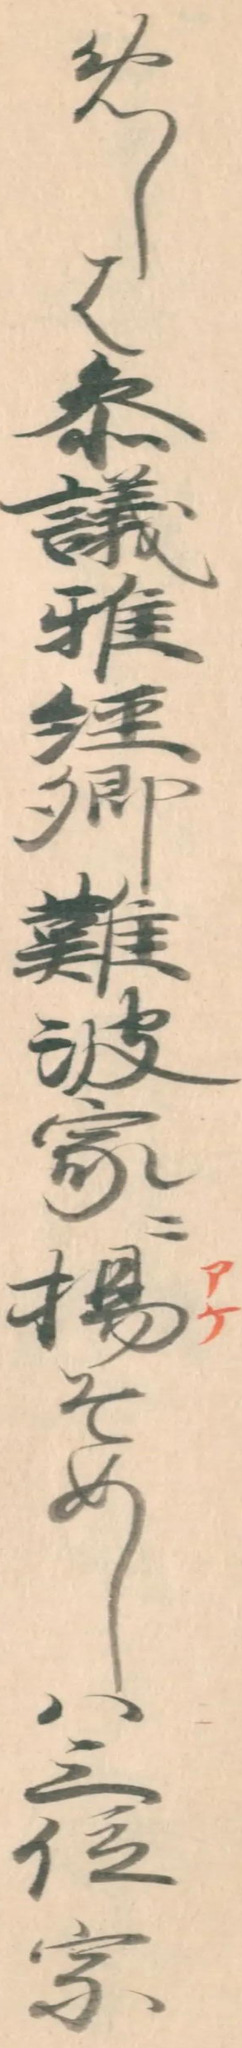めしは参議雅經卿難波家に揚そめしは三位家
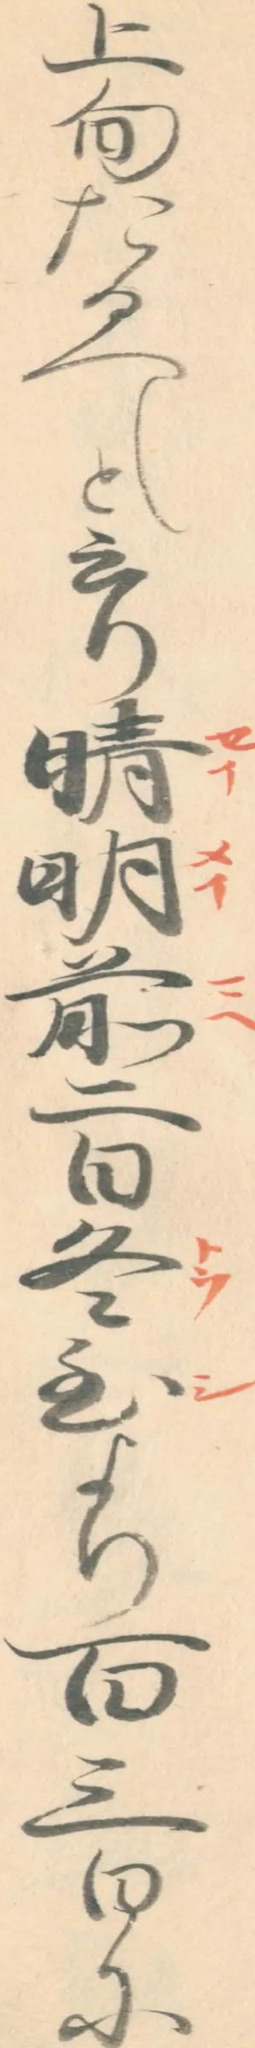上旬たるへしと云り晴明前二日冬至より百三日に
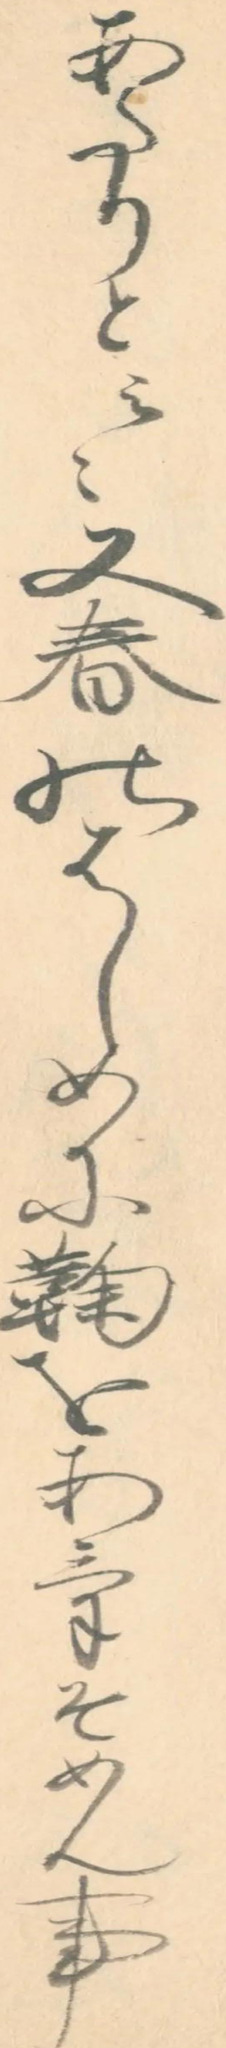あたりと云々又春はしめに鞠をあけそめん事

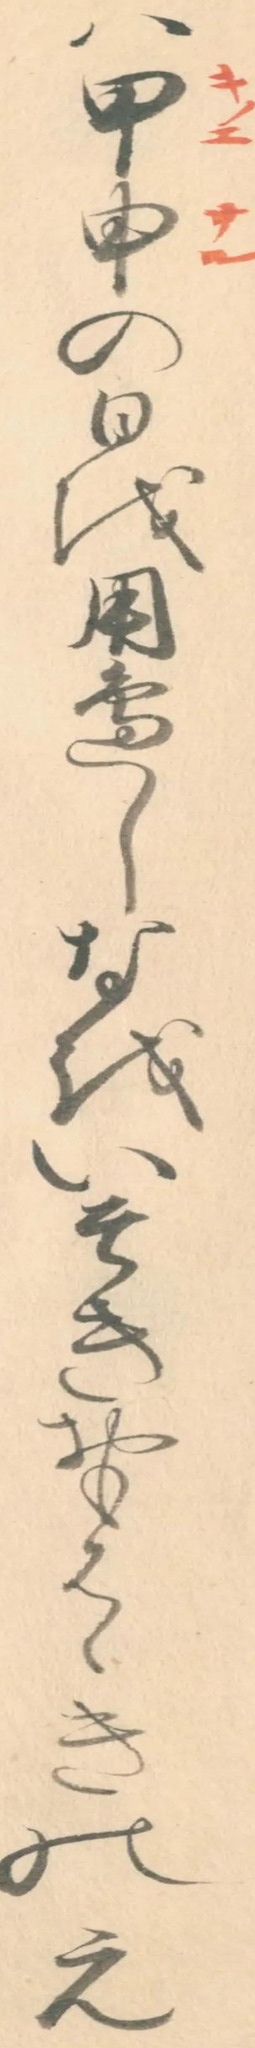は甲申の日を用へしなをいそきおもはゝきのえ
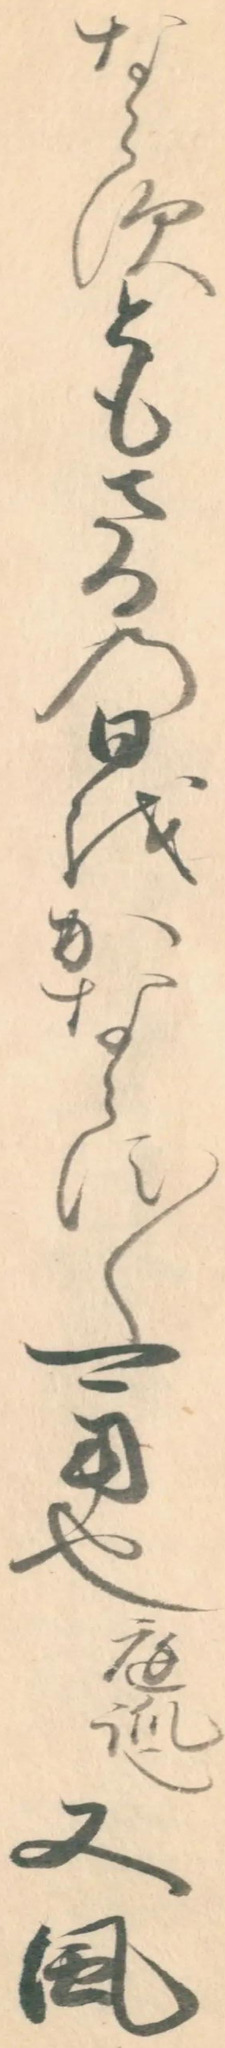ならすともさるの日をかならす〳〵可用也庭派也又風
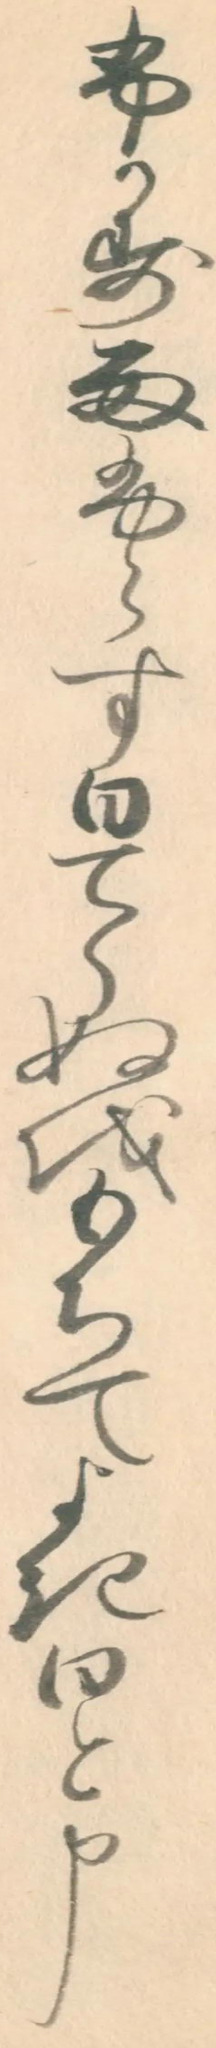ふかす雨ふらす日てらぬをもちてよき日と申
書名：遊庭秘抄 2巻. [1]
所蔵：国立国会図書館 National Diet Library, JAPAN
